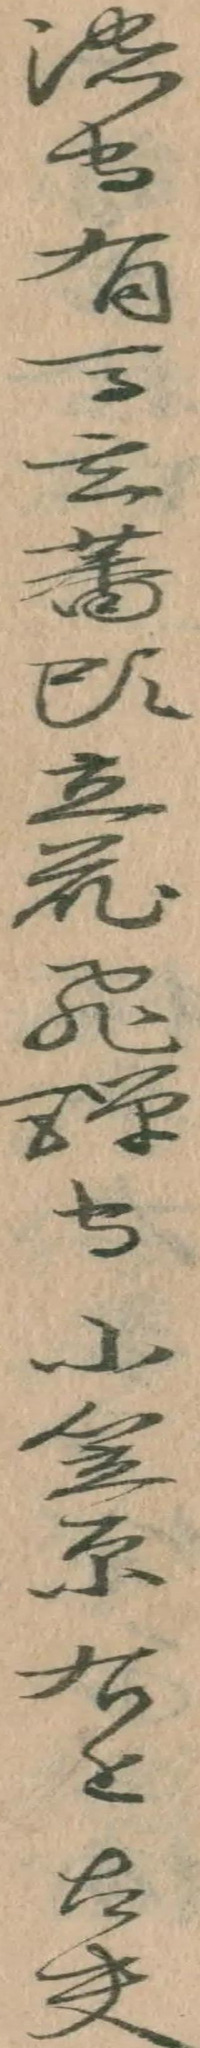濃守有馬玄蕃頭立花飛騨守小笠原右近太夫
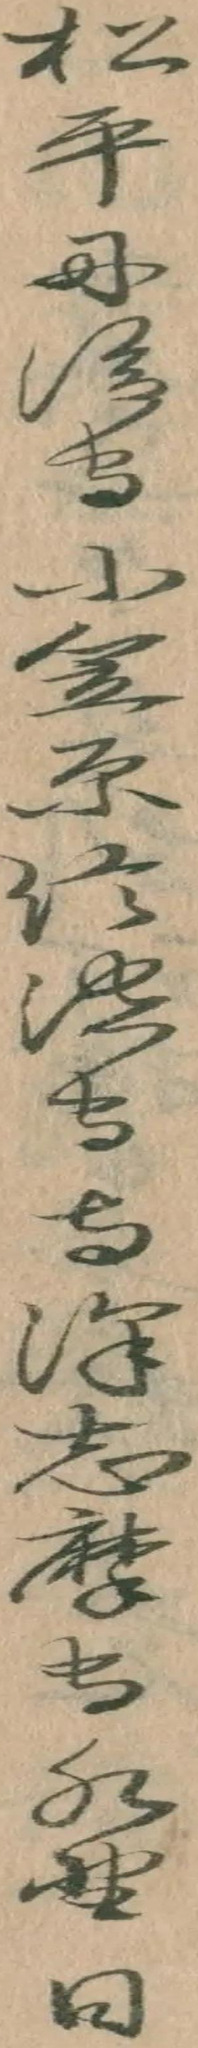松平丹後守小笠原信濃守寺沢志摩守水野日
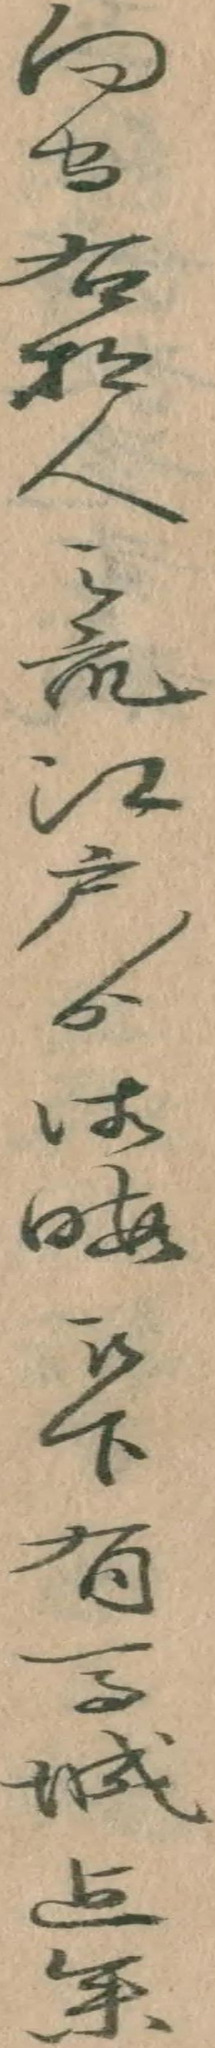向守右拾人之衆江戸ゟ御暇被下有馬城迄参
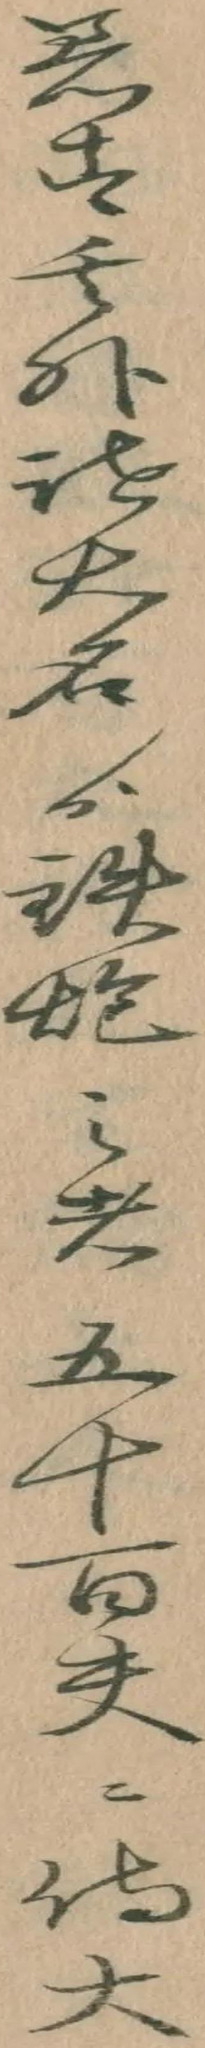着春其外諸大名ゟ鉄炮之者五十百夫に侍大
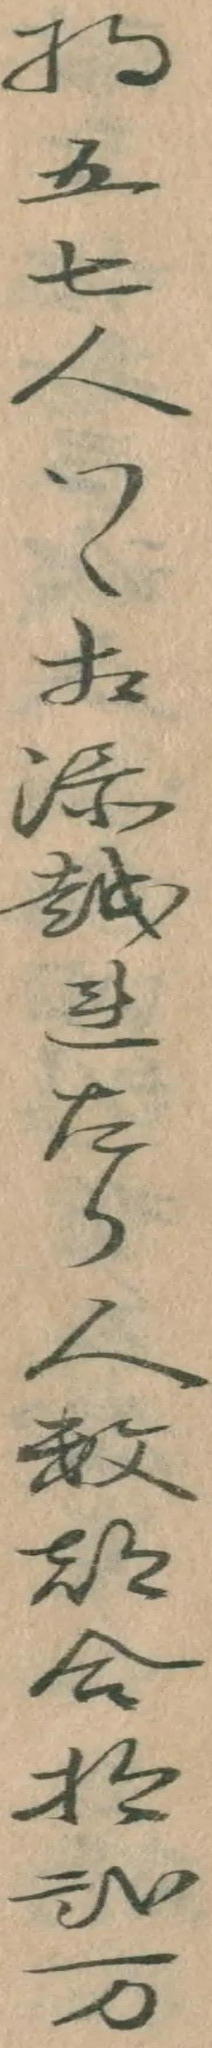将五七人つゝ相添越連たり人数都合拾弐万
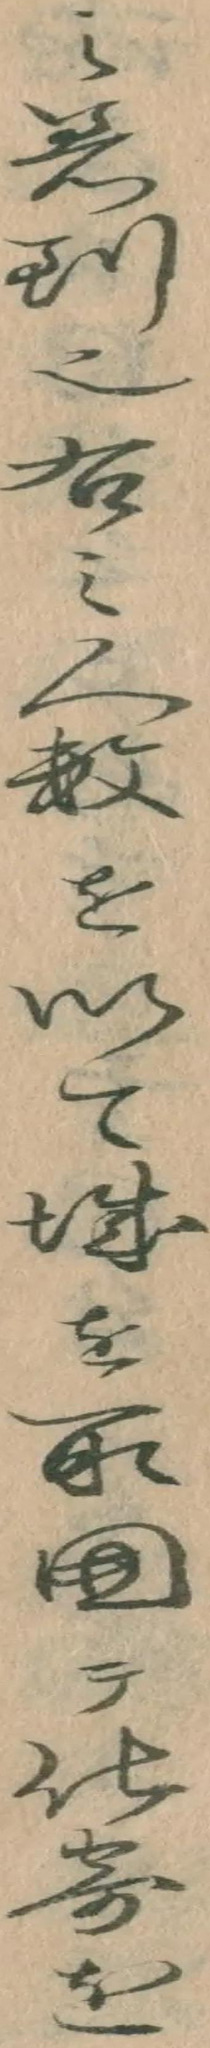之着到也右之人数を以て城を取囲て仕寄を
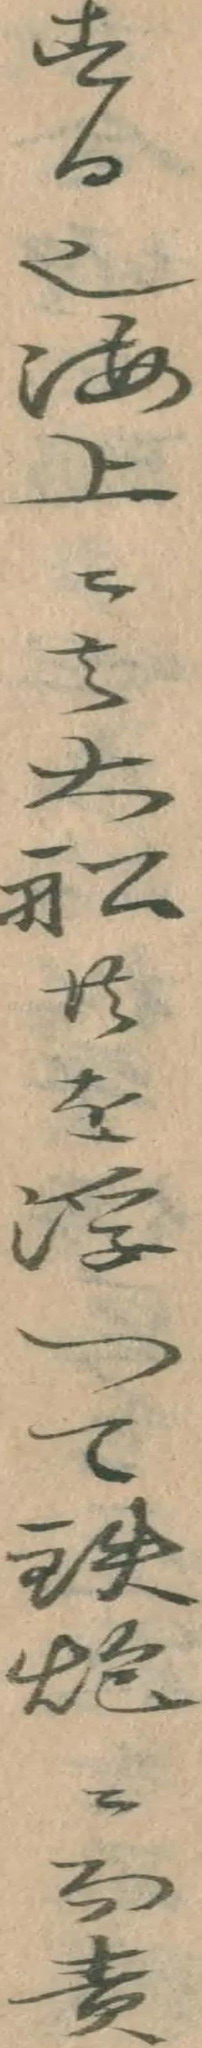春る也海上に者大舩共を浮へて鉄炮に而責
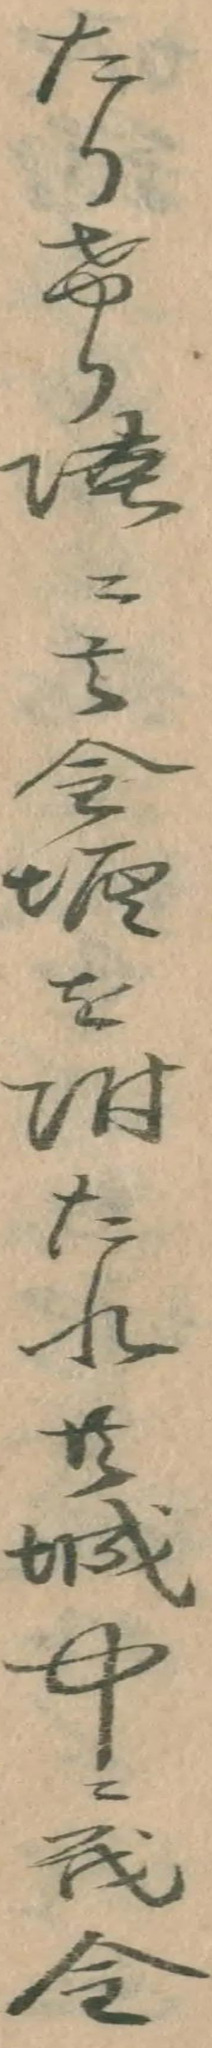たり希り陸に者金堀を附たれ共城中に茂金

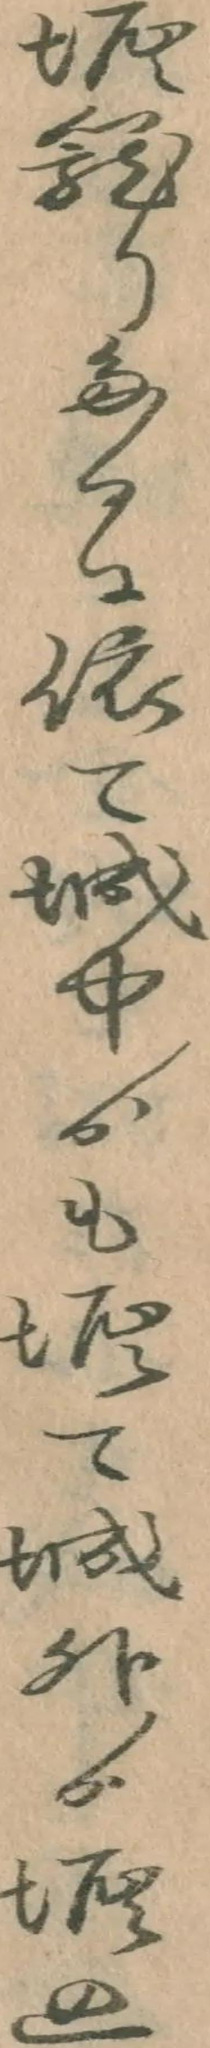堀籠り多る尓依て城中ゟも堀て城外ゟ堀込
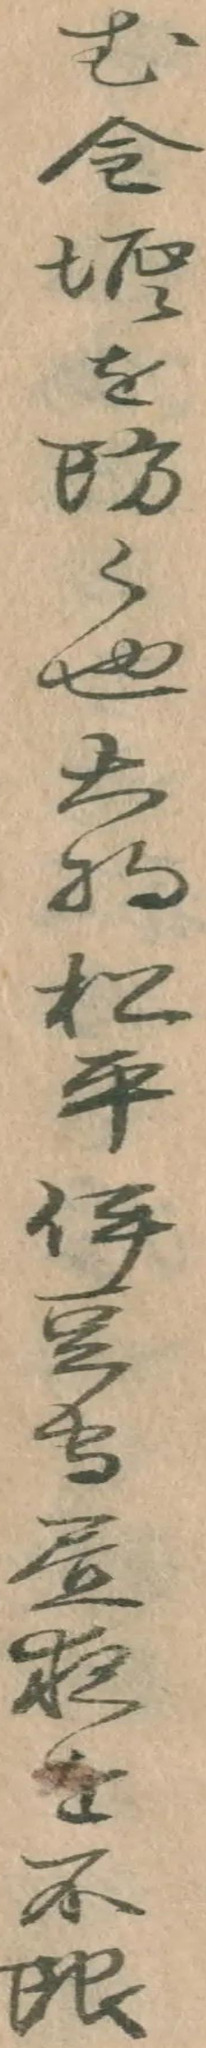む金掘を防く也大将松平伊豆守昼夜を不限
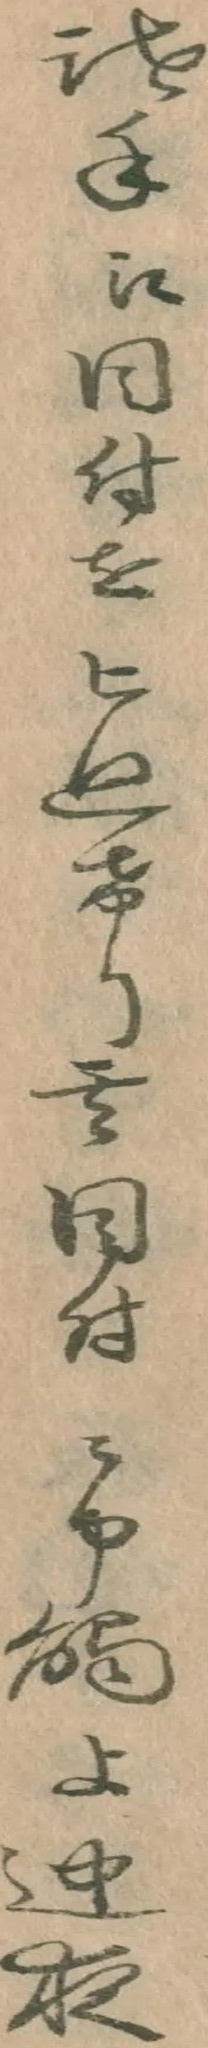諸手江目付を被廻希り其目付に申触よ迚夜
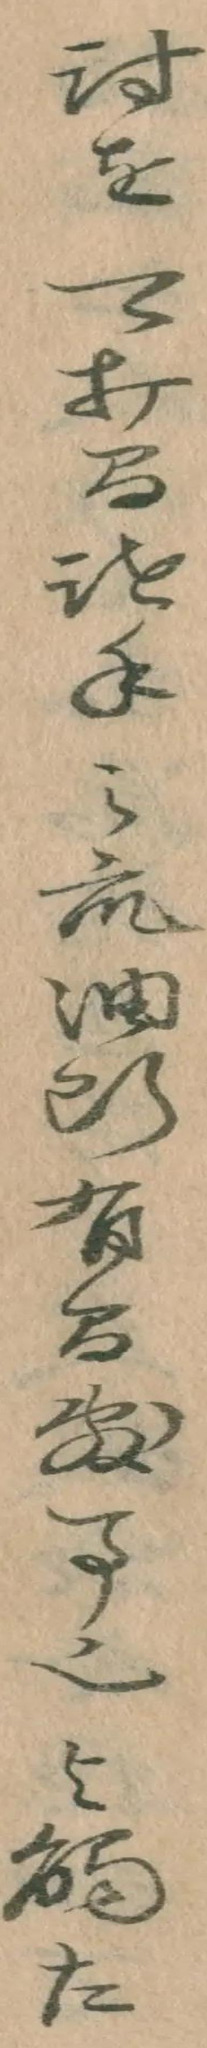討を可打間諸手之衆油断有間敷事也与触た
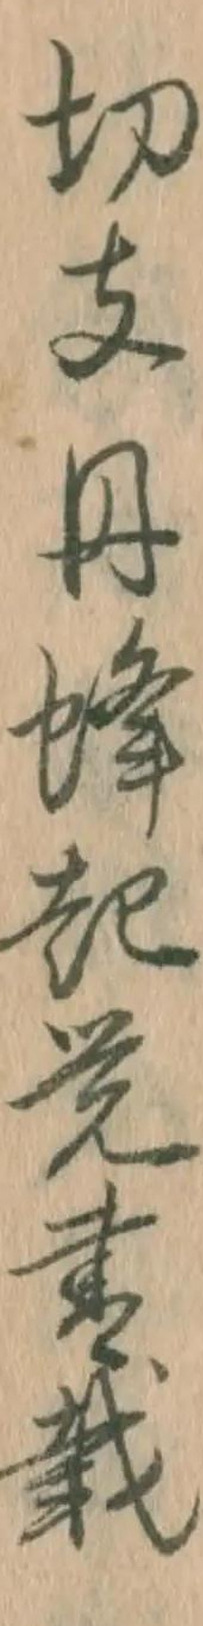切支丹蜂起覚書載
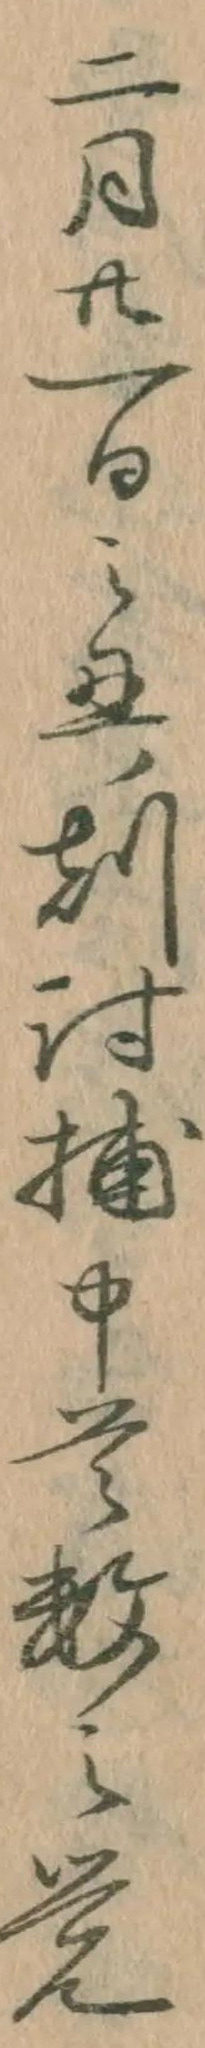二月廿一日丑之刻討捕申首数之覚
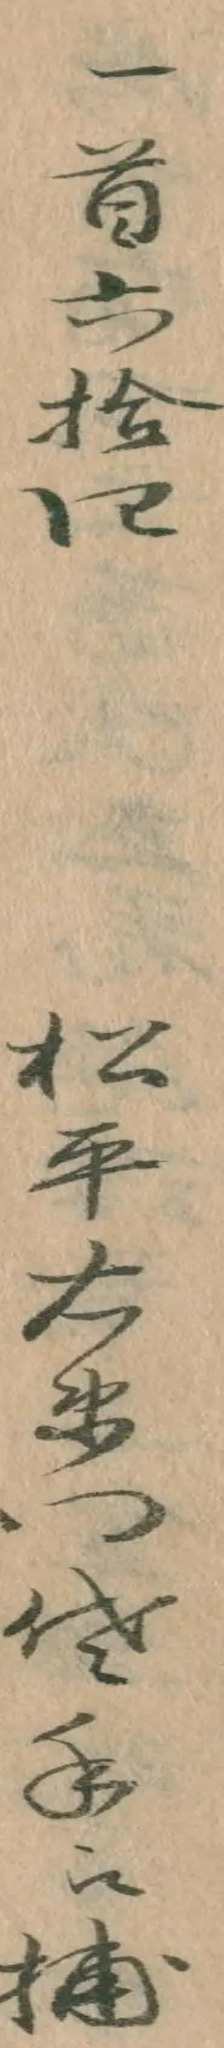一首六拾四松平右衛門佐手江捕
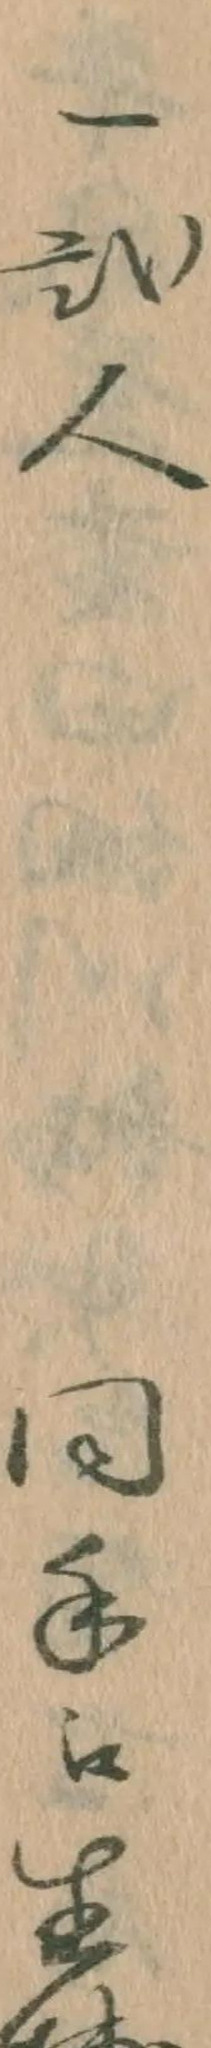一弐人同手江生捕
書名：切支丹御退治記 49巻. [7]
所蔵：国立国会図書館 National Diet Library, JAPAN
